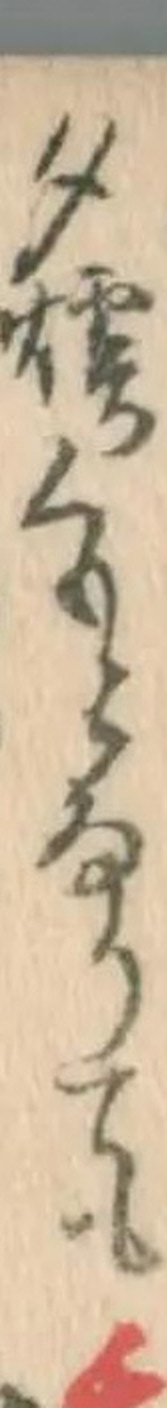夕煙くもとなりても
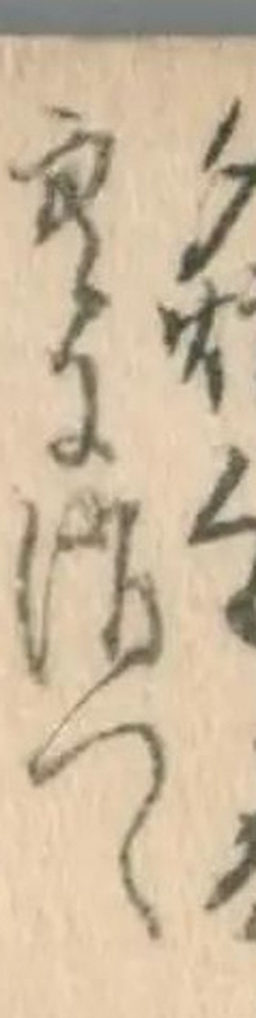空に消つゝ
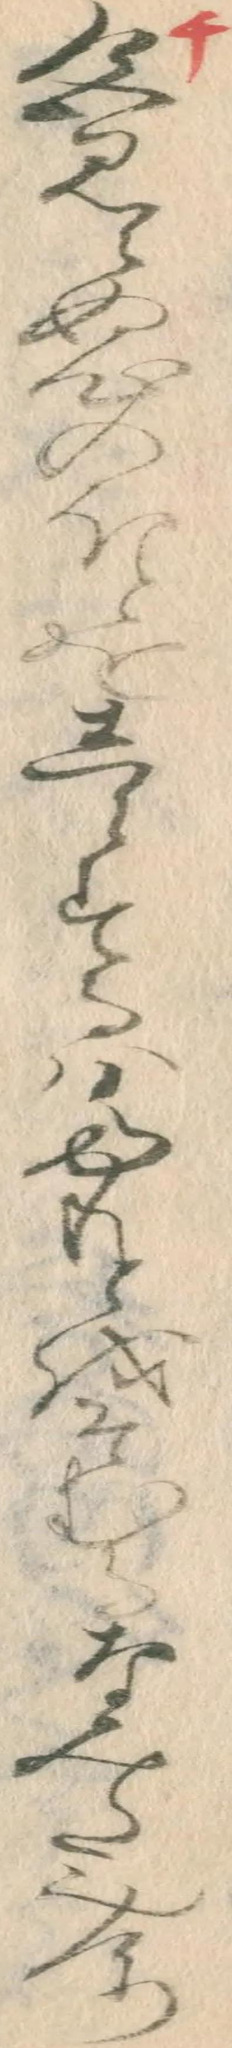色見えぬ心のほとをしらするはたもとをそむるなみた也けり
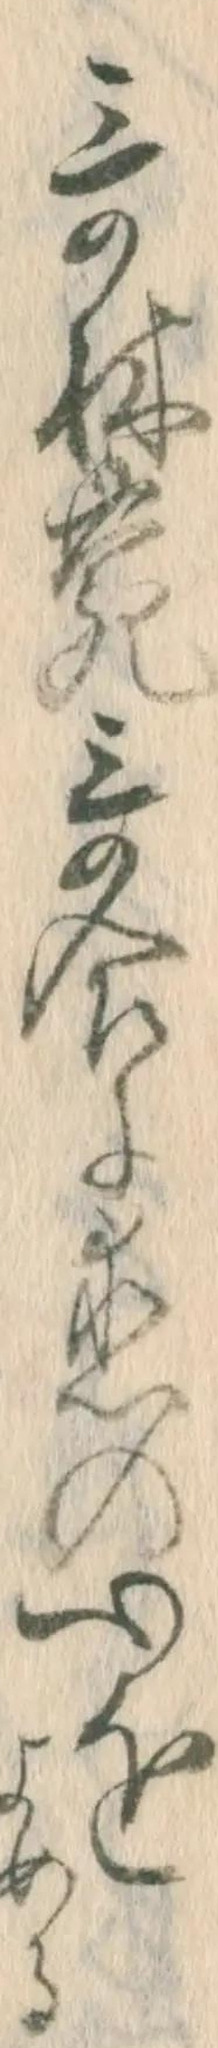歌林苑歌合に恋の心をよめる
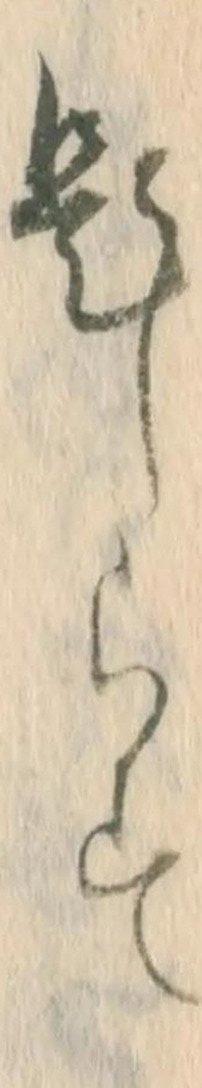題しらす
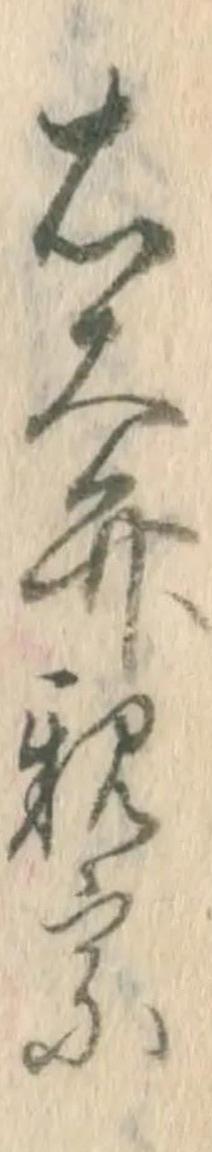右大弁親宗
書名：月詣和歌集
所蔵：国立国会図書館 National Diet Library, JAPAN
